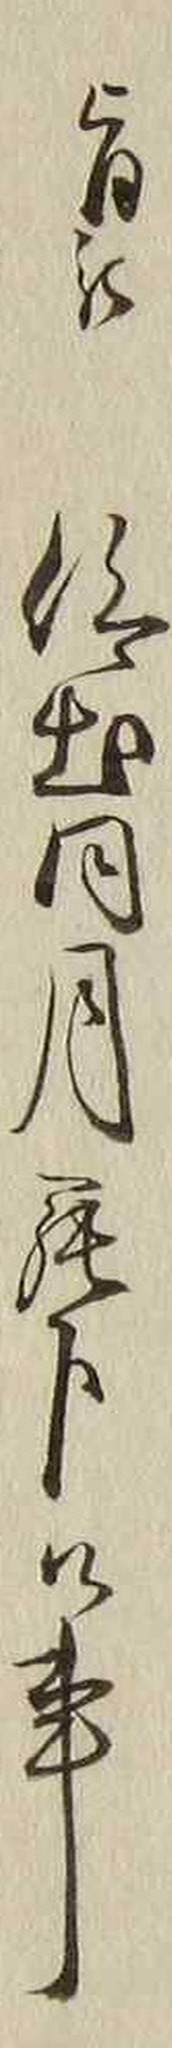旨被仰出同月罷下候事
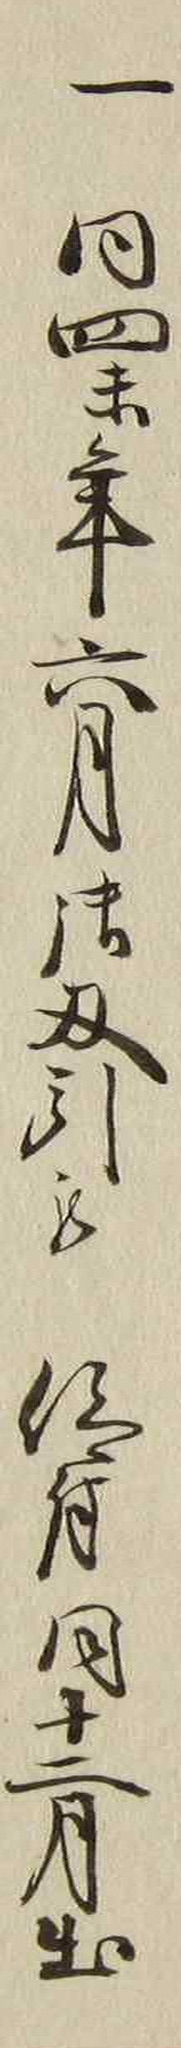一同四未年六月御刃引被仰付同十二月出
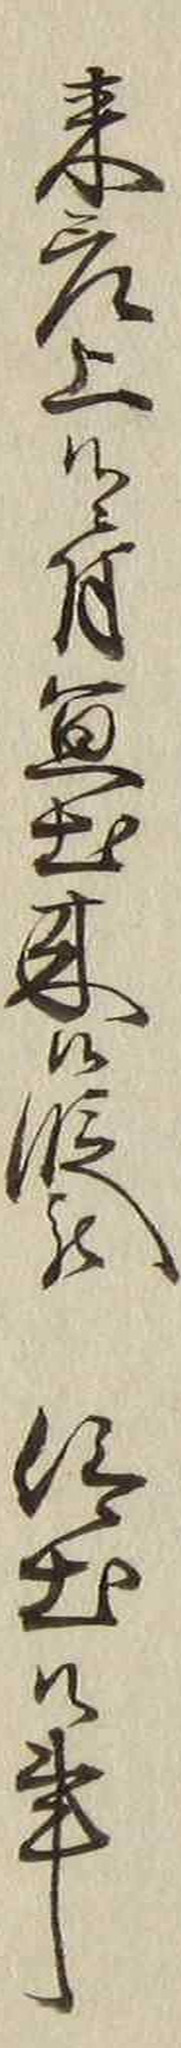来差上候に付宣出来候段被仰出候事
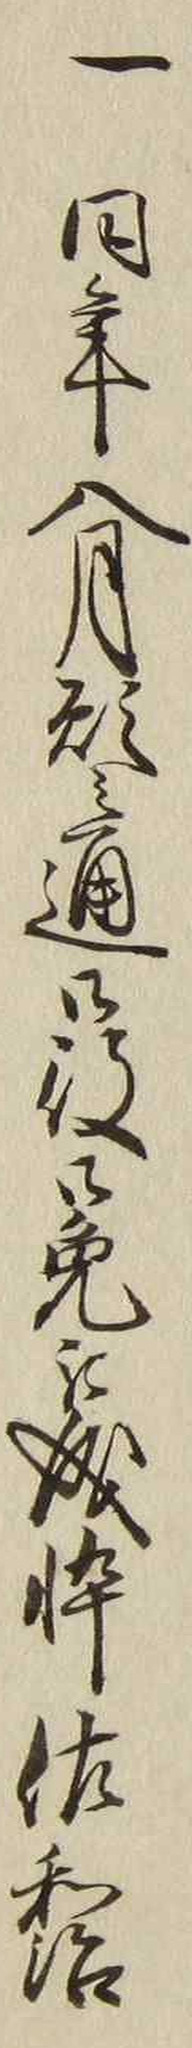一同年八月願之通御役御免被成忰佐和治
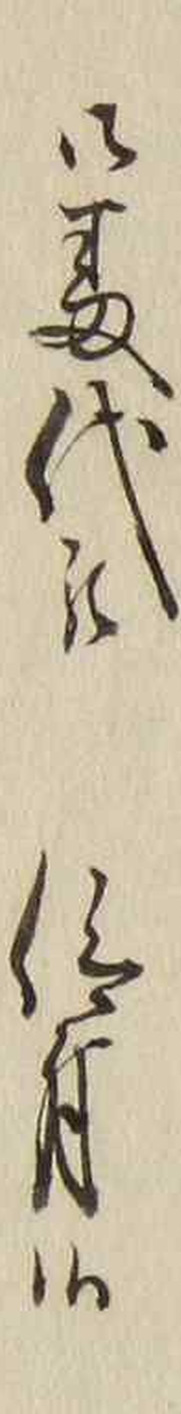御番代被仰付候

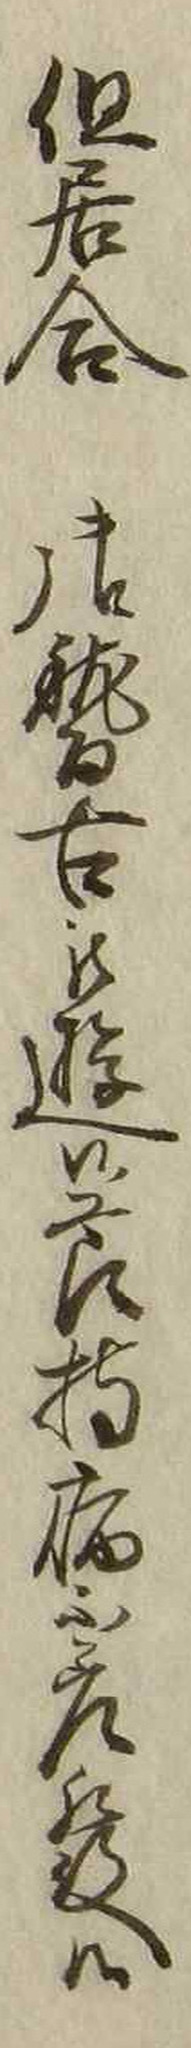但居合御稽古被遊候節持病不差發候
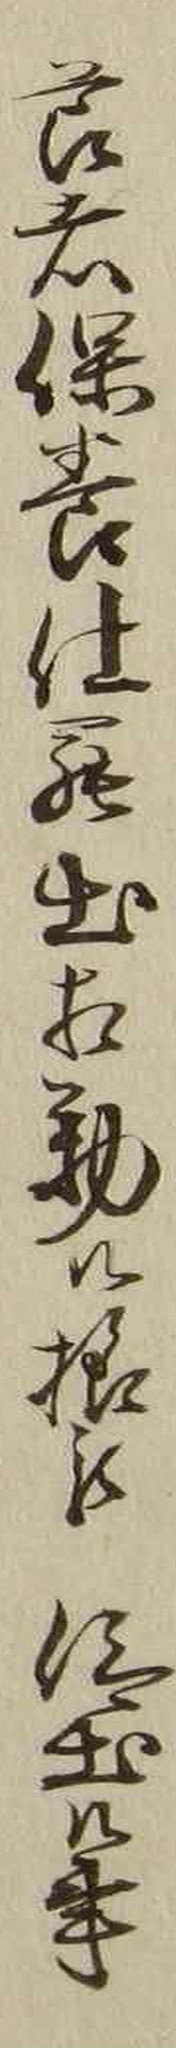節は保養仕罷出相勤候様被仰出候事
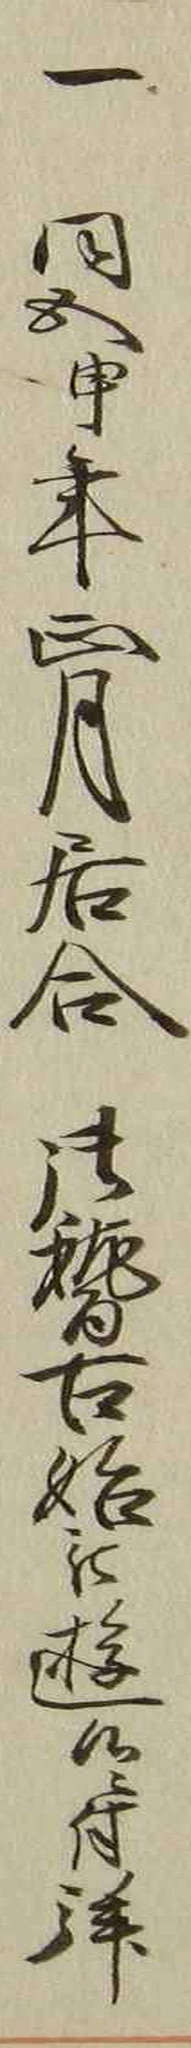一同五申年正月居合御稽古始被遊候に付拝
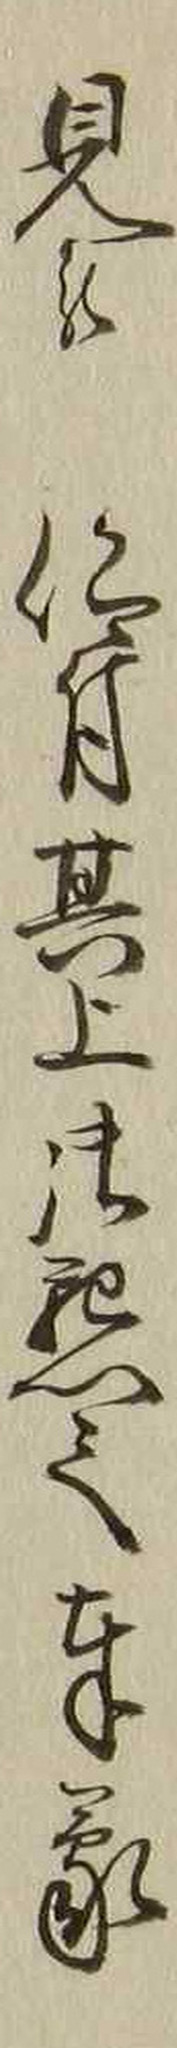見被仰付其上御懇之奉蒙
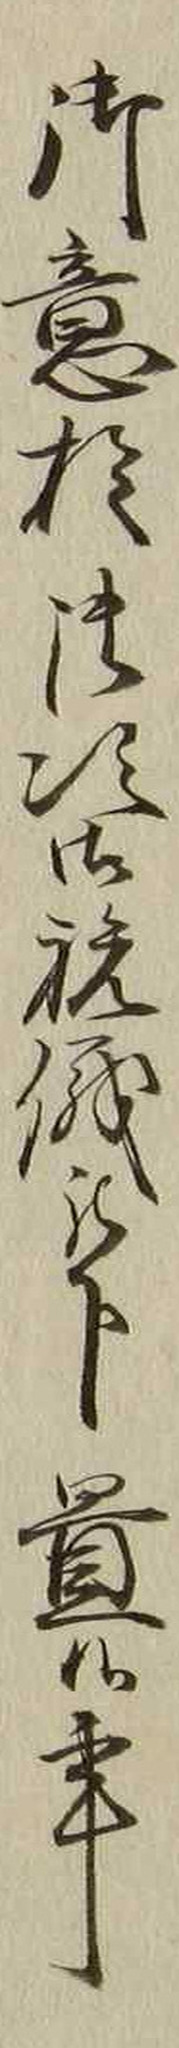御意於御次御祝儀被下置候事
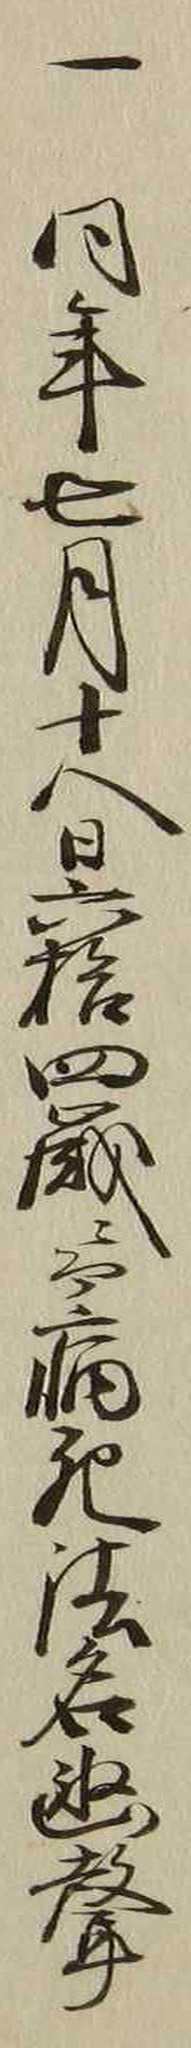一同年七月十八日六拾四歳に而病死法名幽声
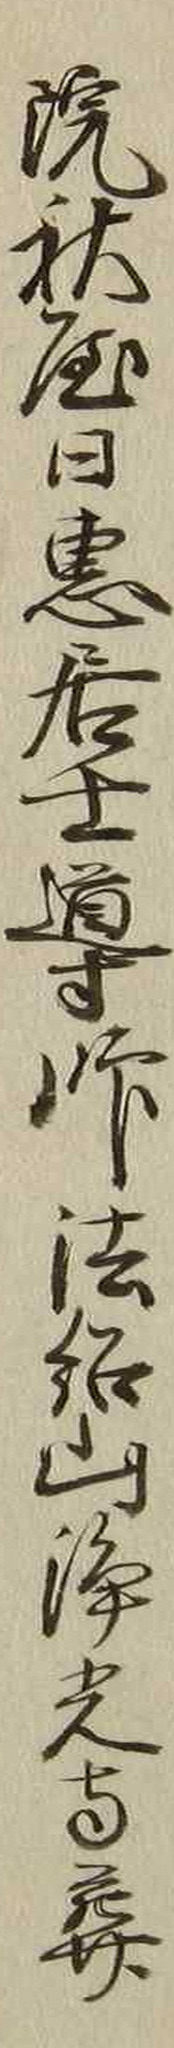院秋屋日恵居士導師法招山浄光寺葬
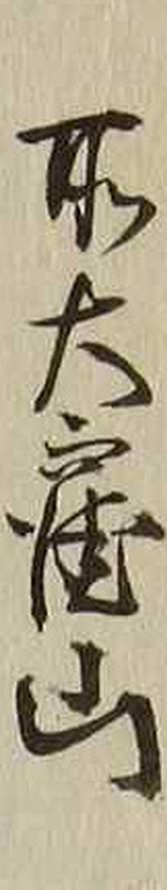所大窪山
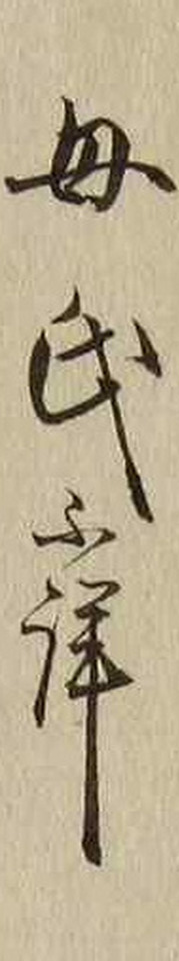母氏不詳
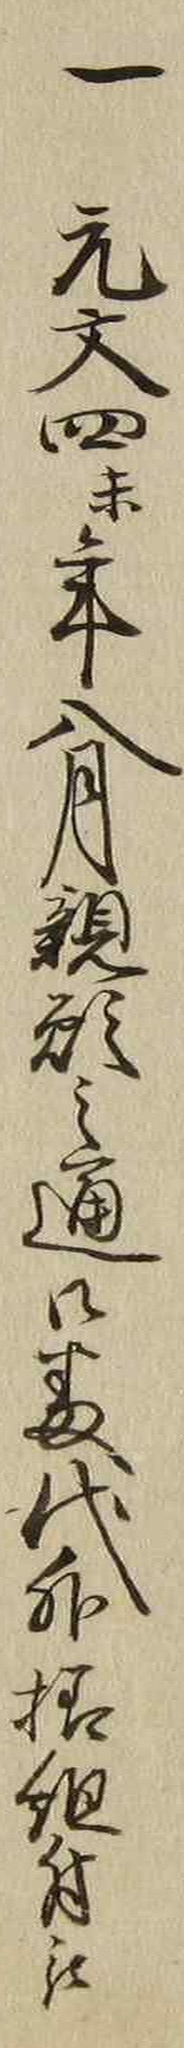一元文四未年八月親願之通御番代外様組付被
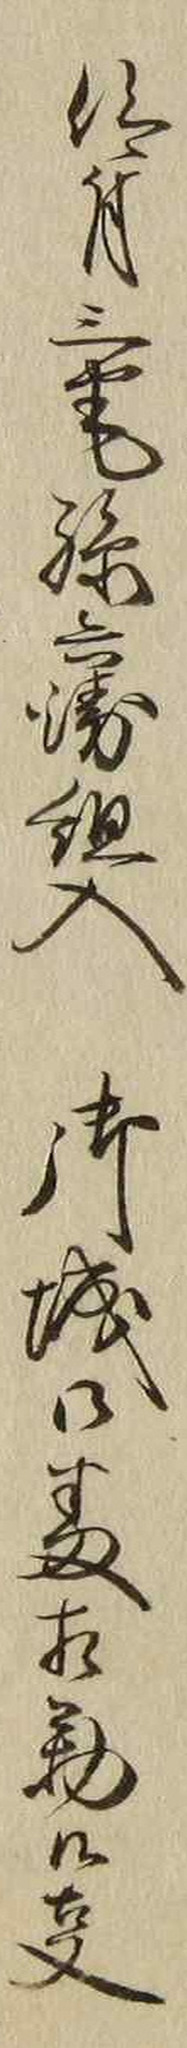仰付三宅孫兵衛組入御城御番相勤候事
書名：諸士系譜　巻之67　を之部1
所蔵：会津若松市立会津図書館
